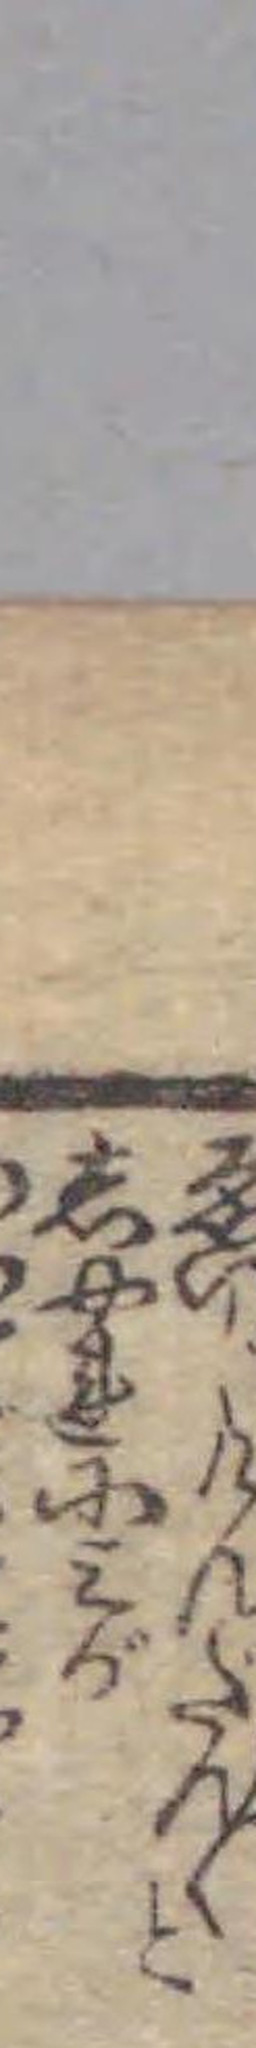しやれにみが
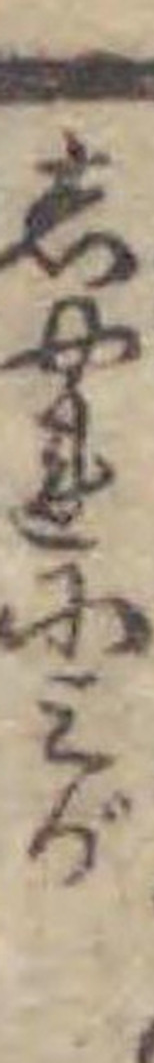しやれにみが
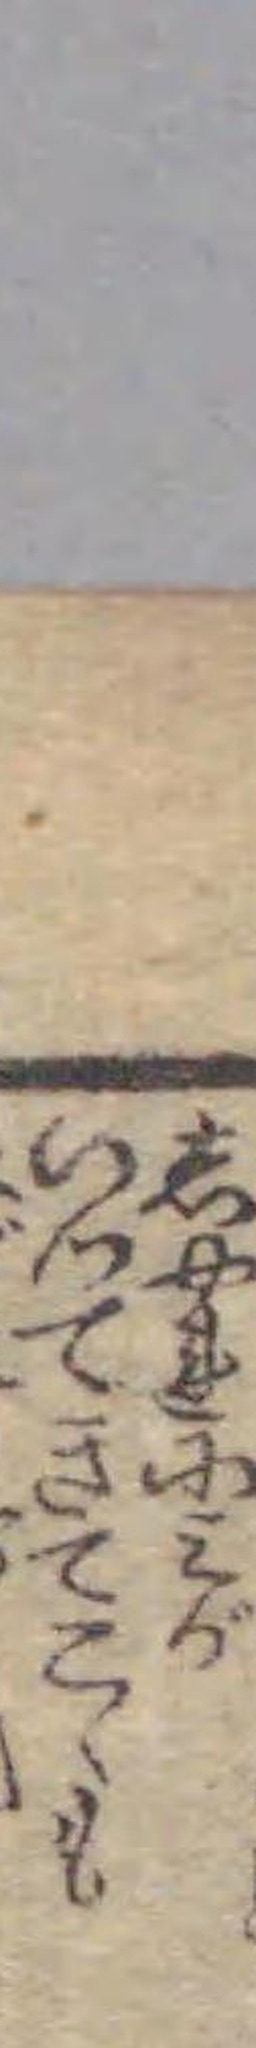いつてきてこゝも
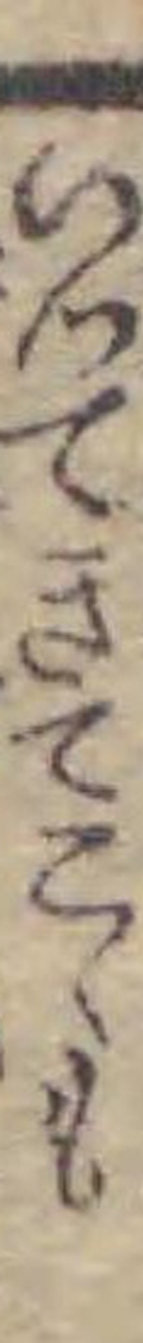いつてきてこゝも
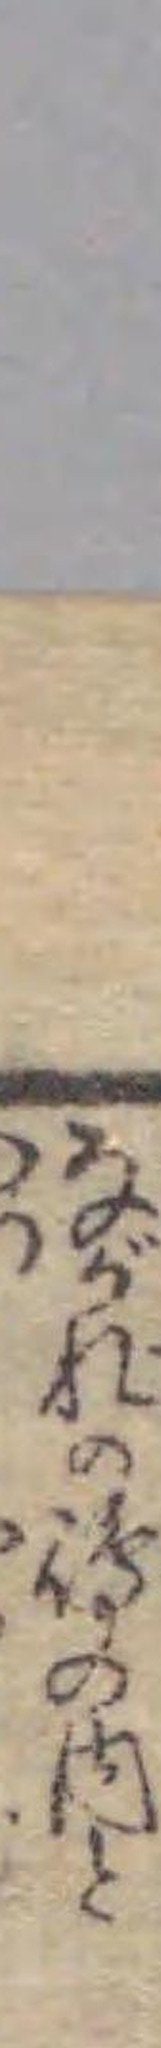ながれの島の内と
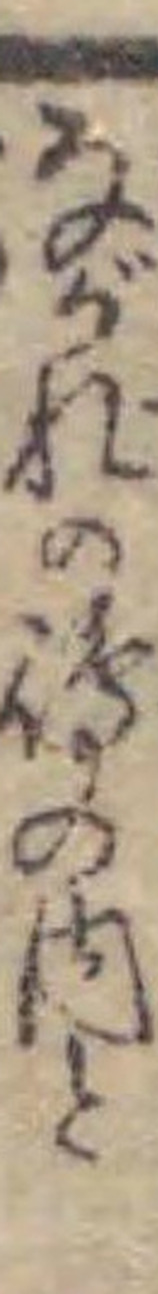ながれの島の内と
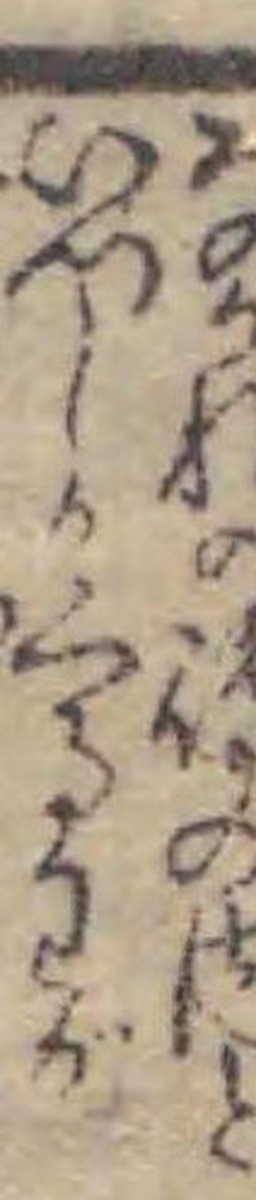いつしかくるわが
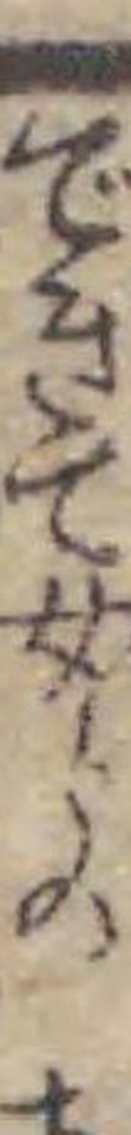できて女郎の
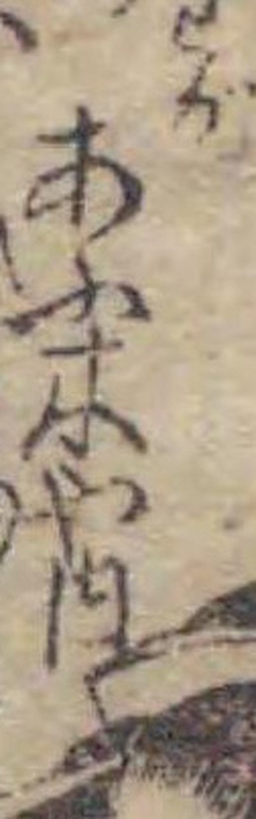あふ木や内
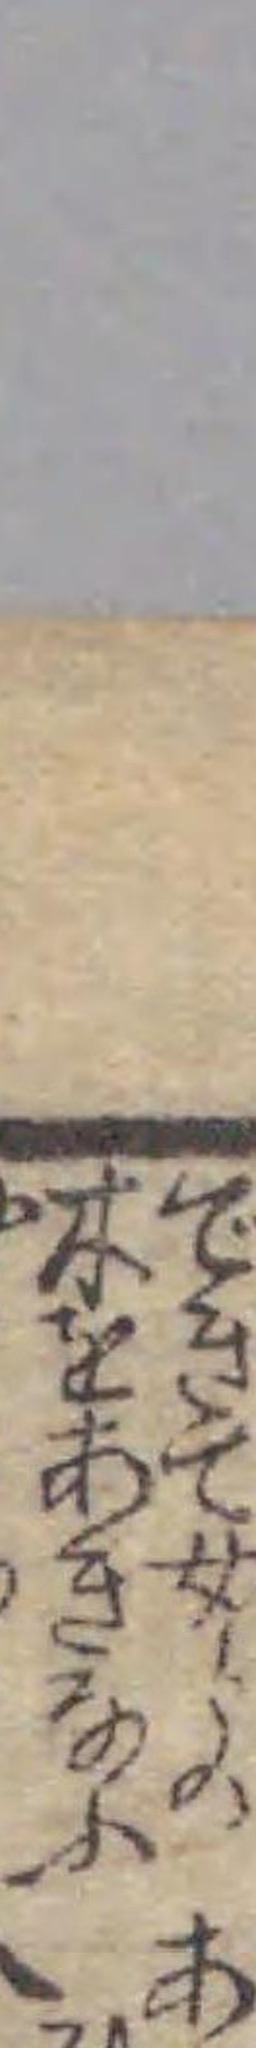木をあきなふ
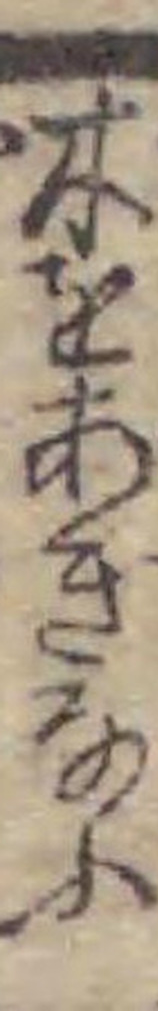木をあきなふ
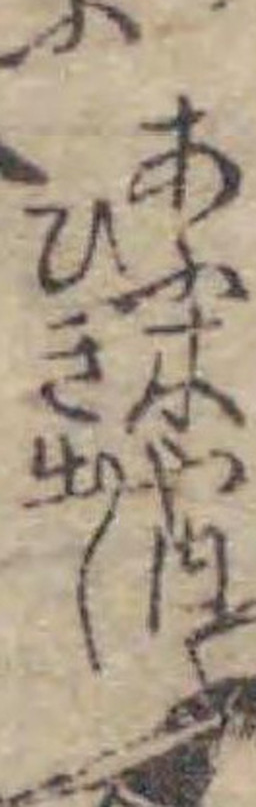ひき出し
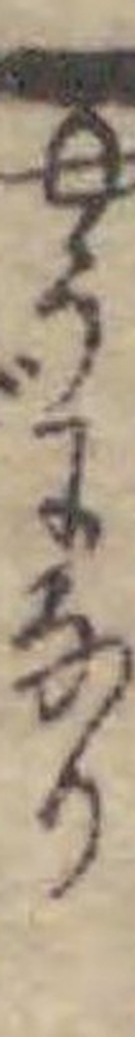やうになり
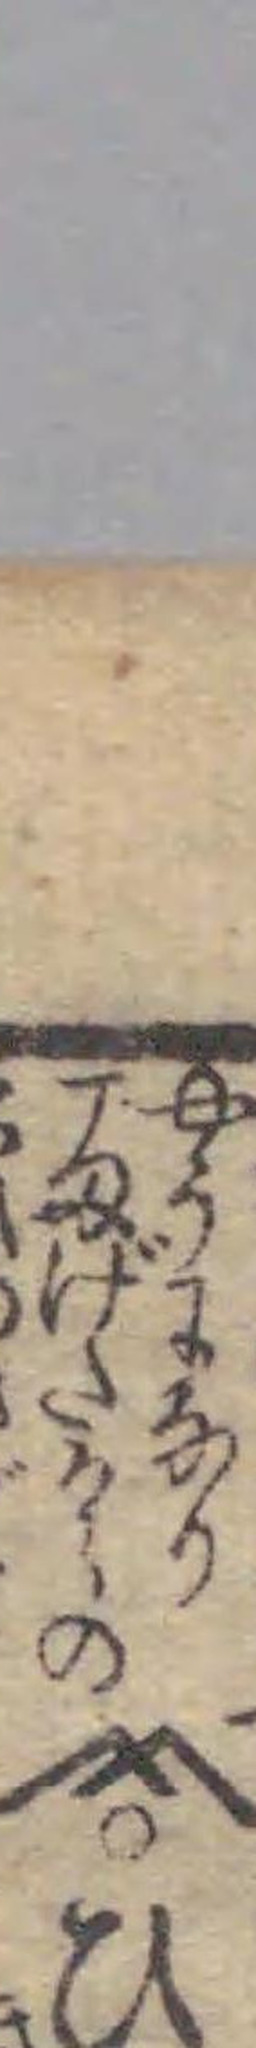こまげたからの
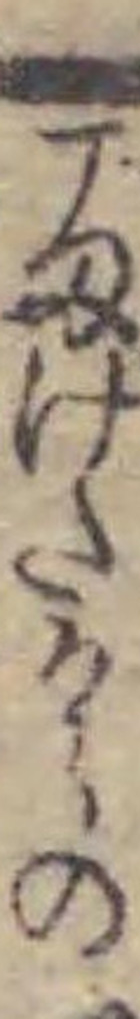こまげたからの
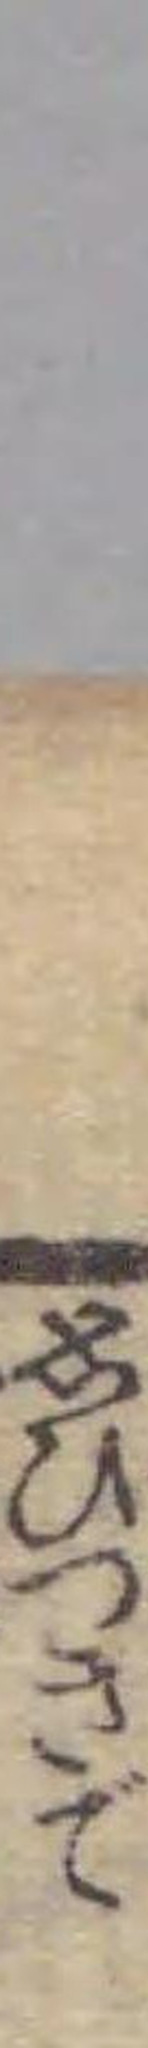思ひつきで
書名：奇妙頂礼胎錫杖 : 3巻
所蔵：国立国会図書館 National Diet Library, JAPAN
